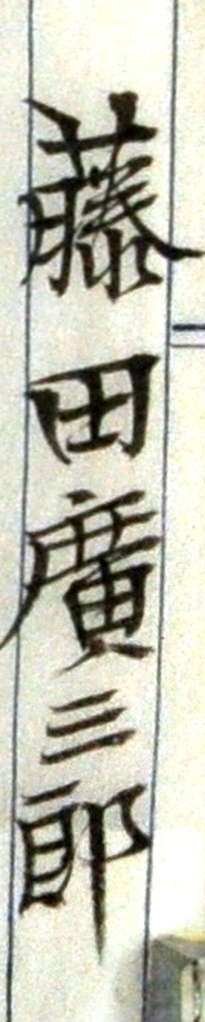藤田広三郎
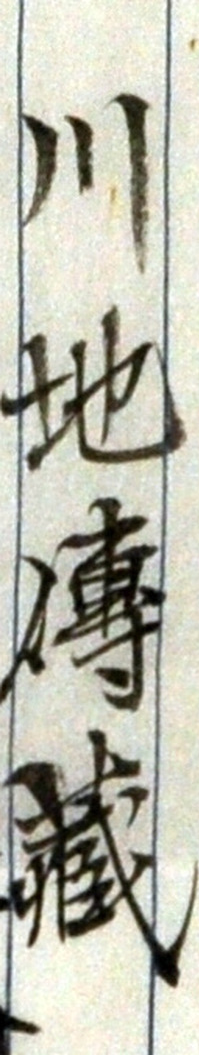川地伝蔵
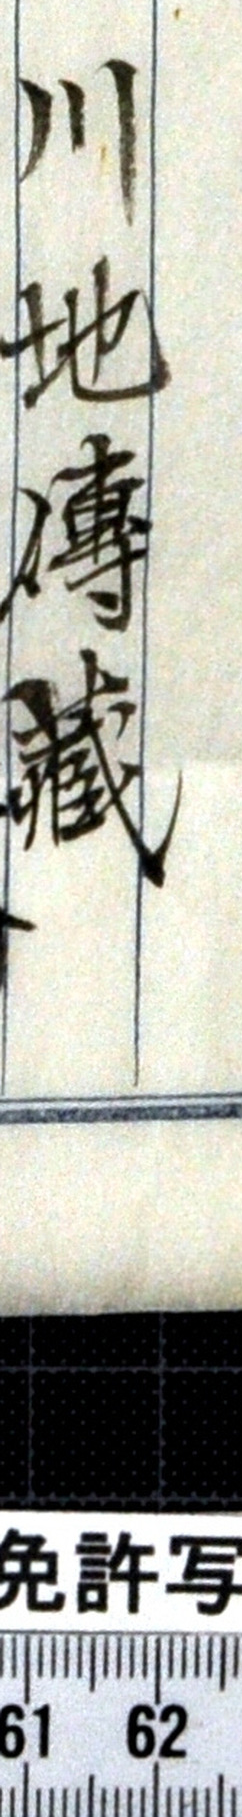川地伝蔵
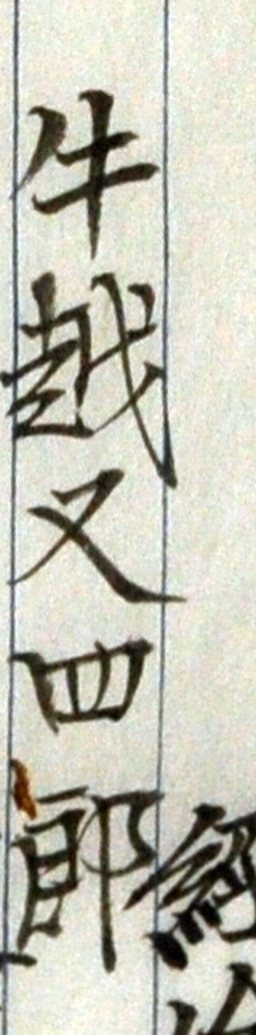牛越又四郎
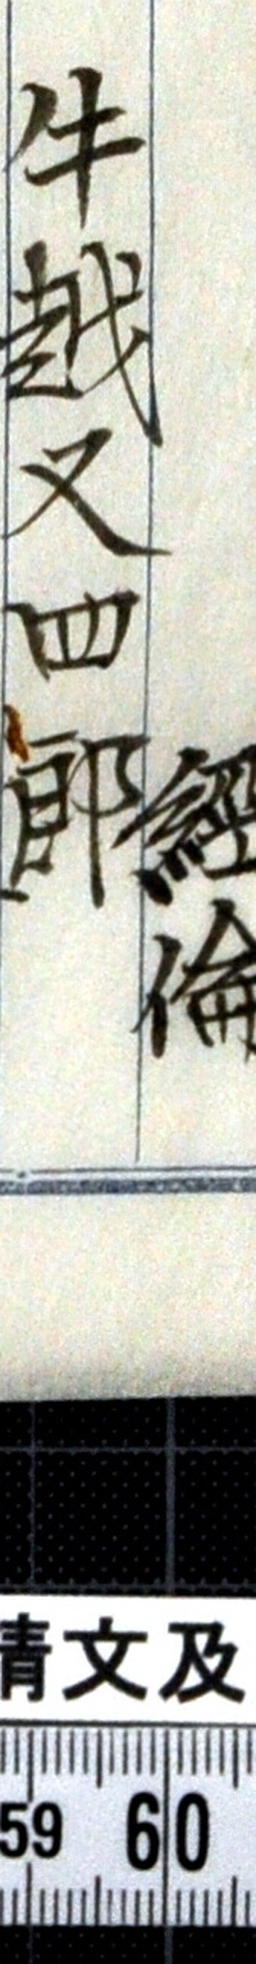牛越又四郎
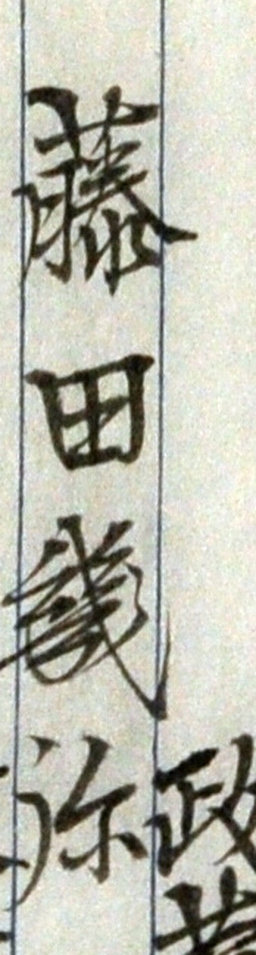藤田幾弥
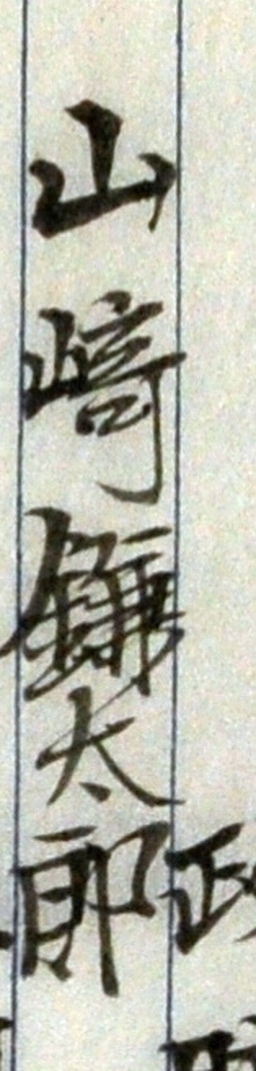山崎鎌太郎
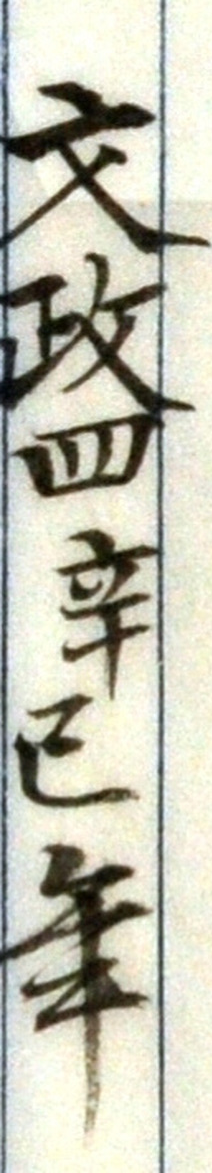文政四辛巳年
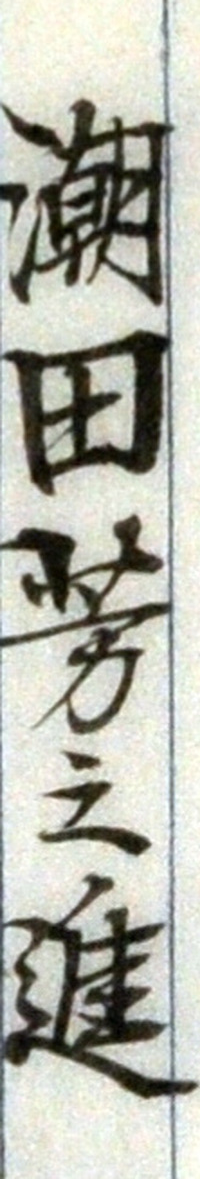潮田芳之進
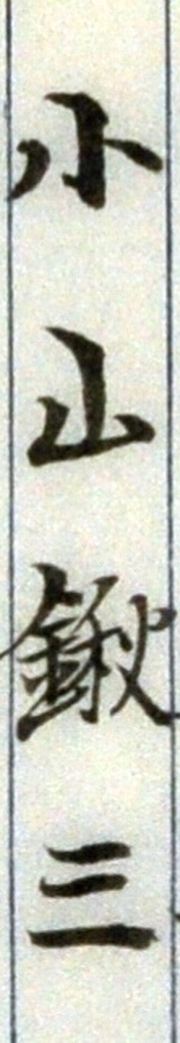小山鍬三
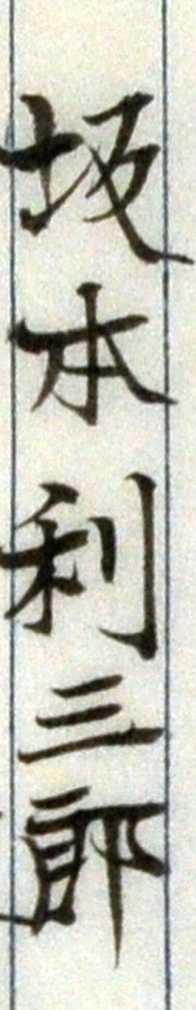坂本利三郎
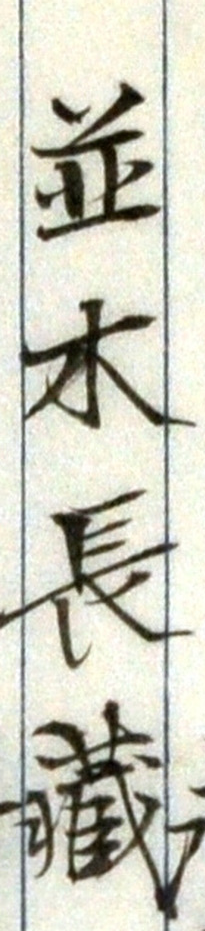並木長蔵
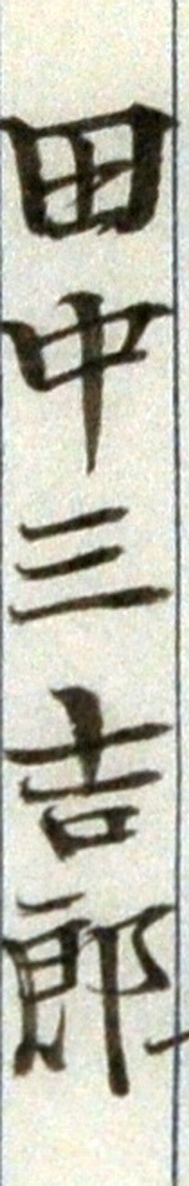田中三吉郎
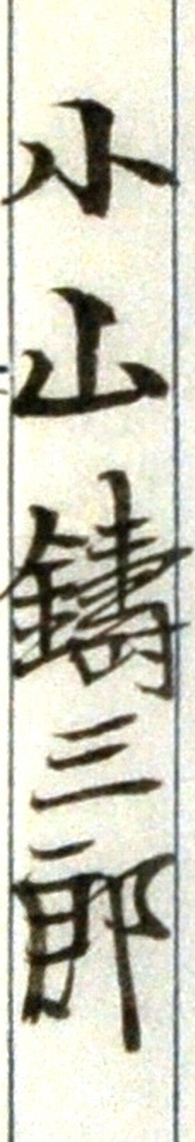小山鋳三郎

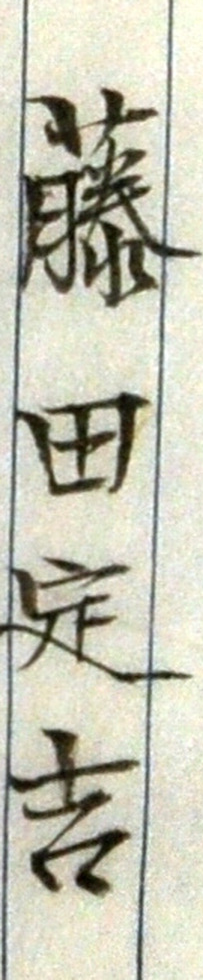藤田定吉
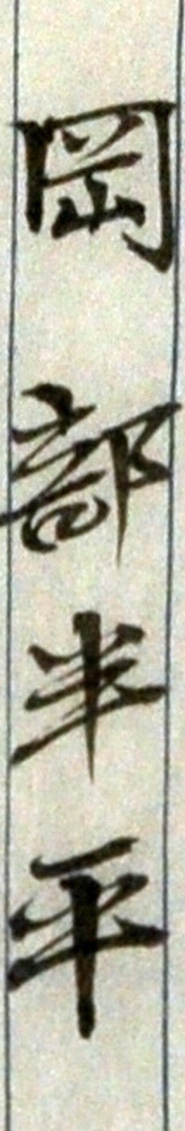岡部半平
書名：竹内流・甲州流・荒木流・一刀流新当流起請文及免許写堤宝山流手鏡及個之大事
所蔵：伊那市立高遠町図書館・合同会社AMANE
